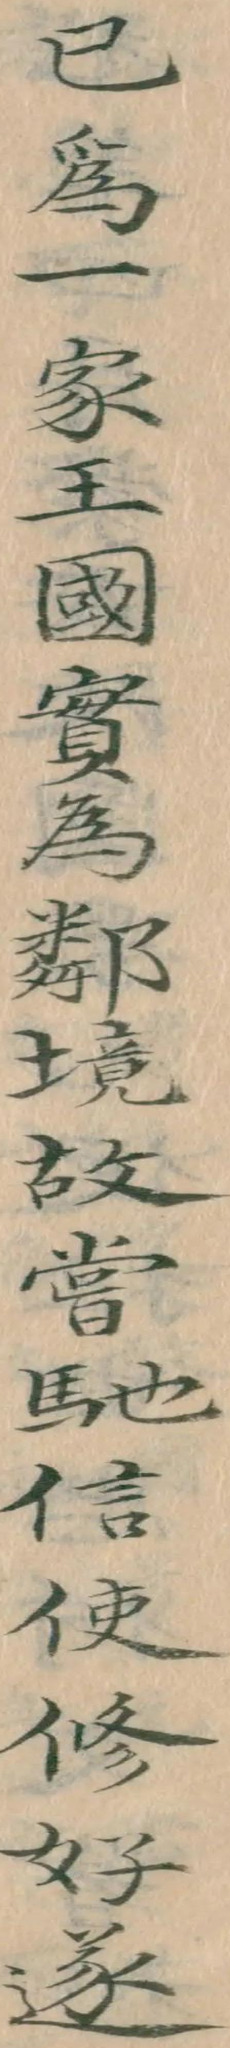已為一家王国実為隣境故嘗馳信使修好遂
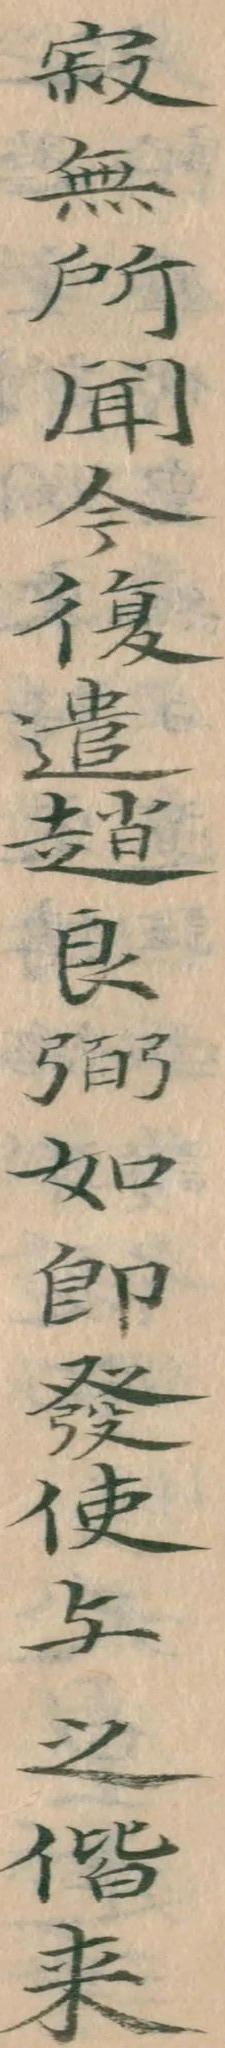寂無所聞今復遣趙良弼如即発使与之偕来
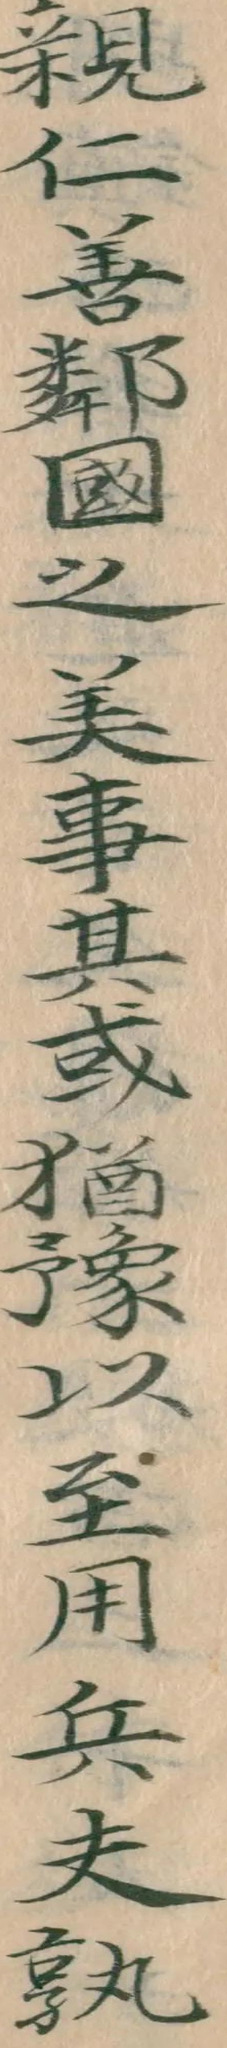親仁善隣国之美事其或猶予以至用兵其孰
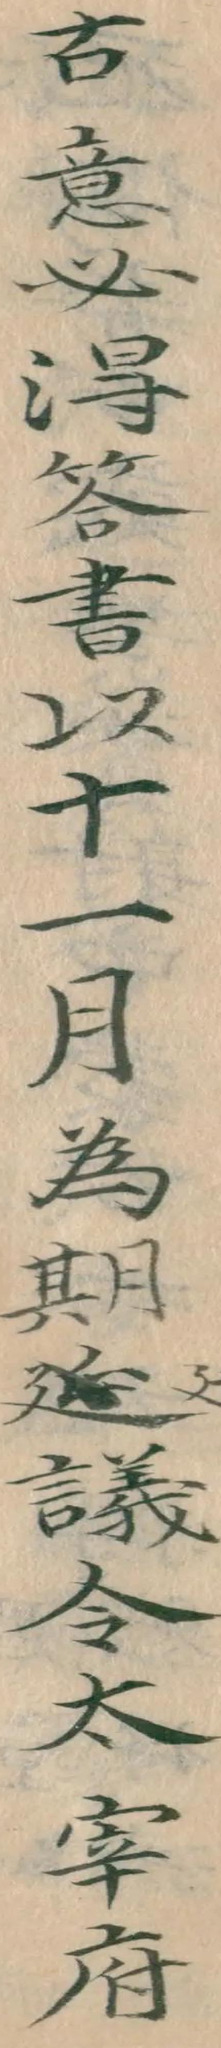古意必淂答書以十一月為期廷議令太宰府

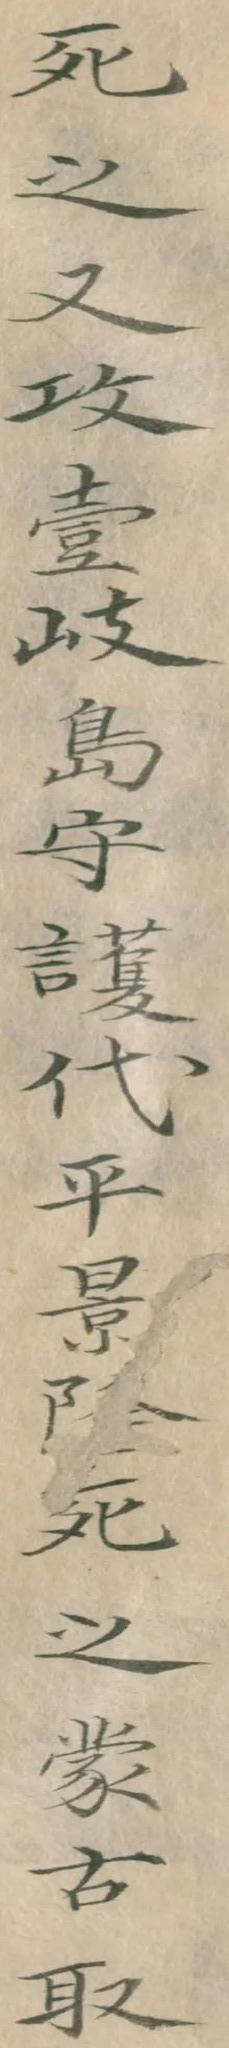死之又攻壱岐島守護代平景隆死之蒙古取
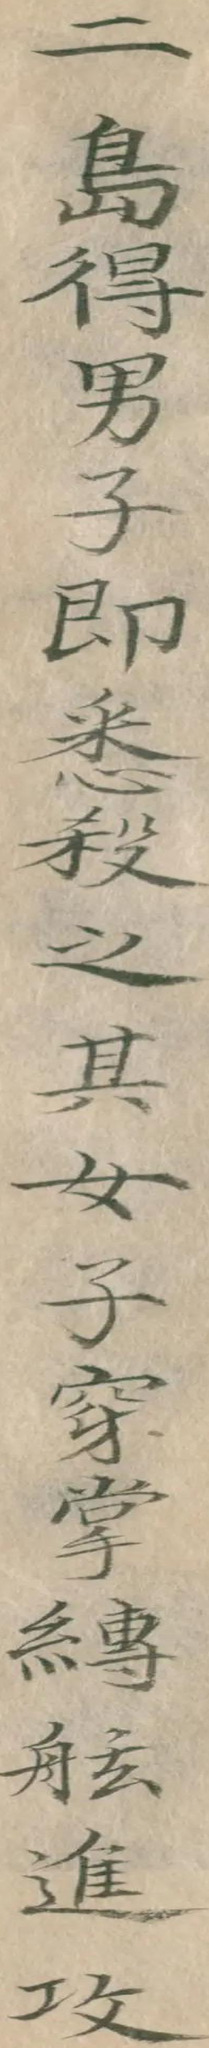二島男子即悉殺之其女子掌縛舷進攻
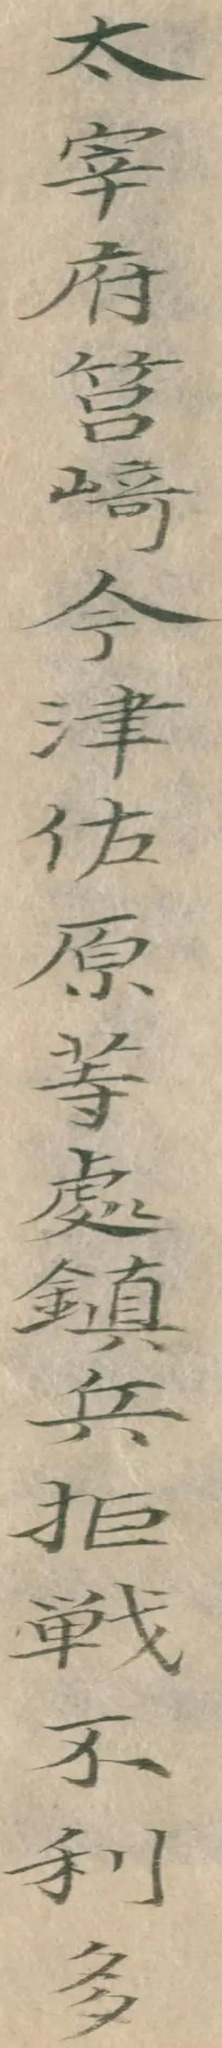太宰府筥崎今津佐原等処鎮兵拒戦不利多
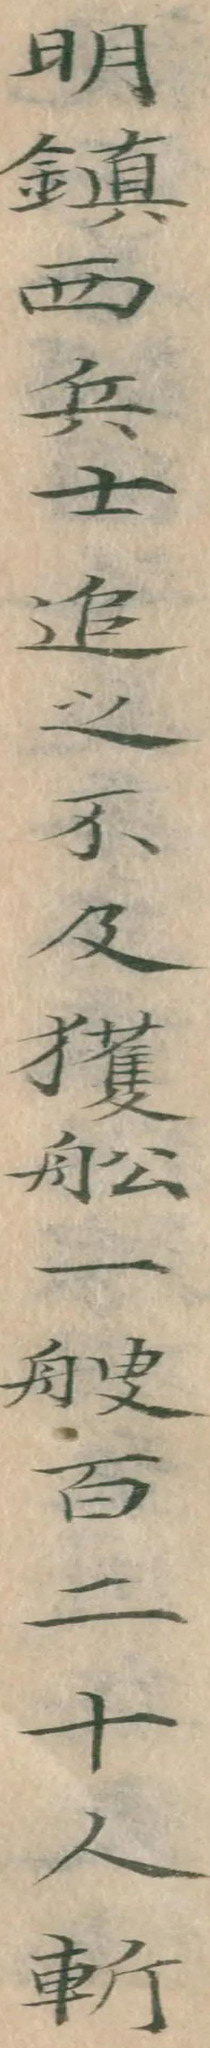明鎮西兵士追之不及獲船一艘百二十人斬
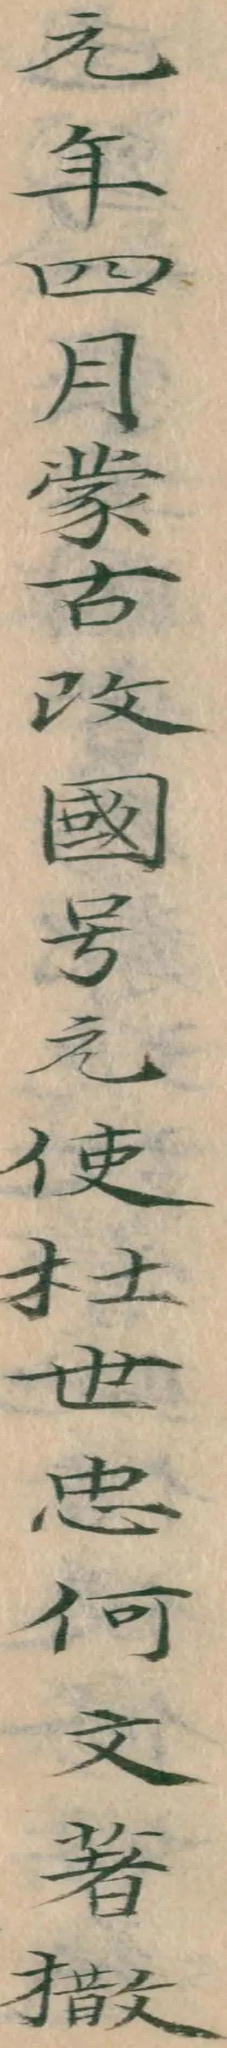元年四月蒙古改国号元使杜世忠何文著撒
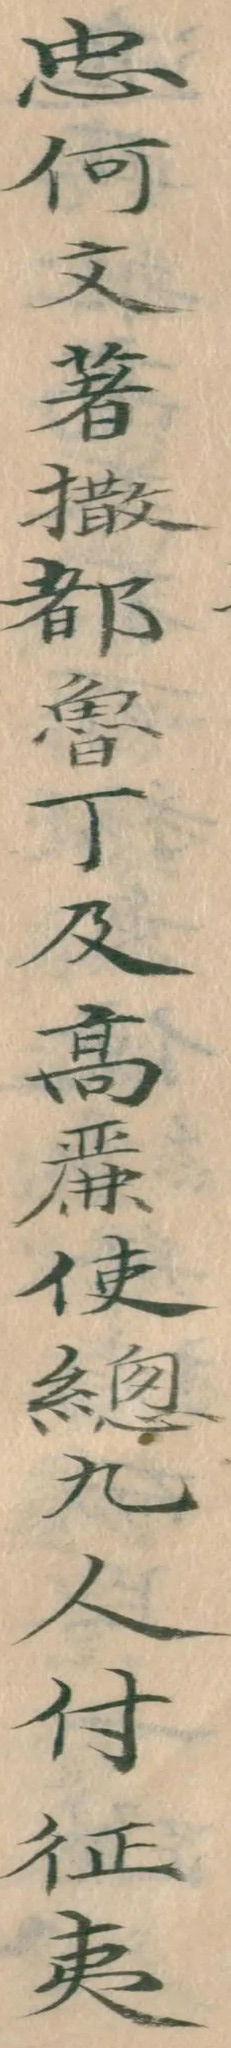忠何文著撒都魯丁及高麗使総九人付征夷
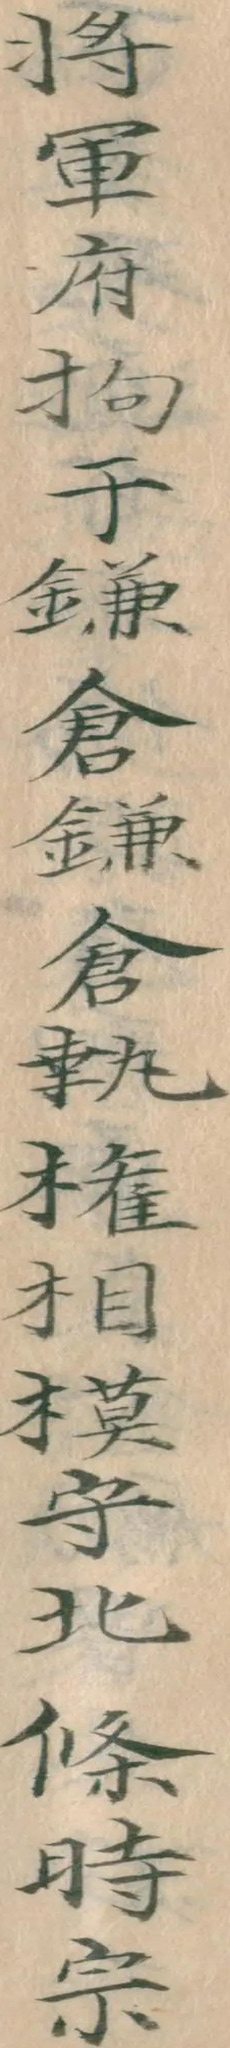将軍府拘于鎌倉鎌倉執権相模守北條時宗
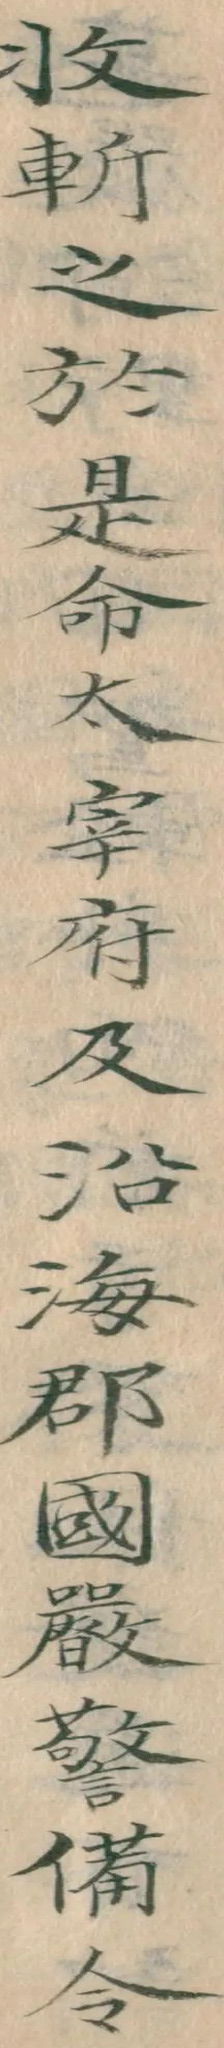収斬之於是命太宰府及沿海郡国厳警備令
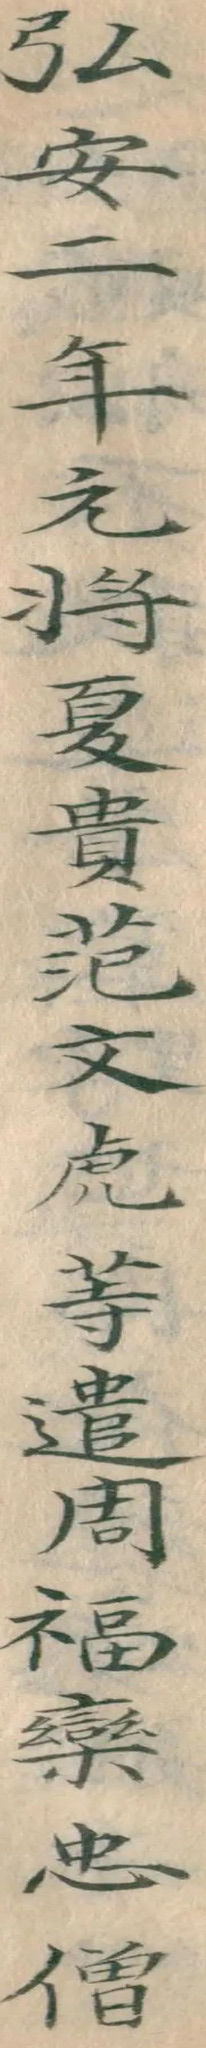弘安二年元将夏貴范文虎等遣周福欒忠僧
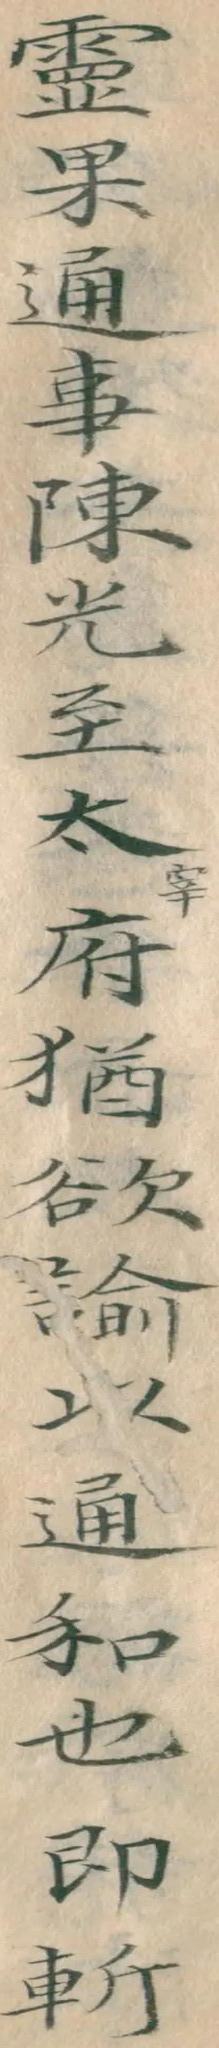霊果通事陳光至太宰府猶欲諭以通和也即斬
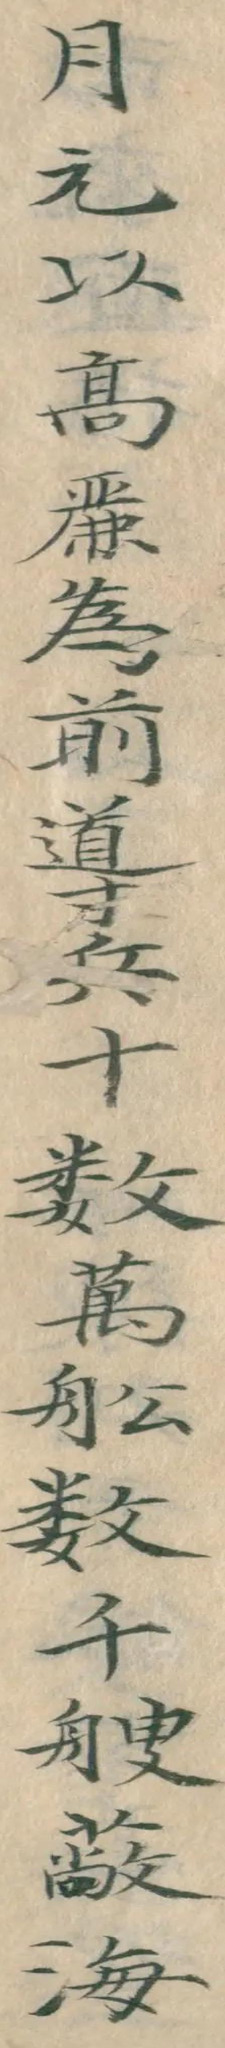月元以高麗為前導兵十数万船数千艘蔽海

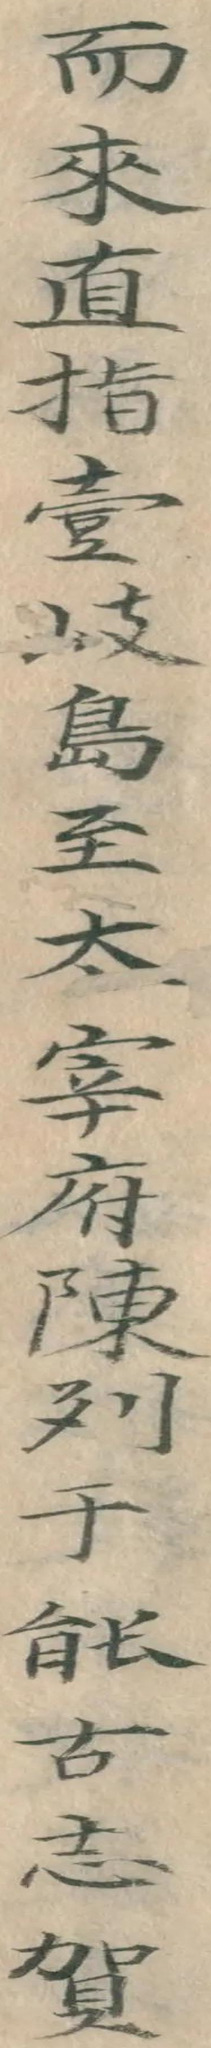而来直指壱岐島至太宰府陳列于能古志賀
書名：輪池叢書. 12
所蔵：国立国会図書館 National Diet Library, JAPAN
